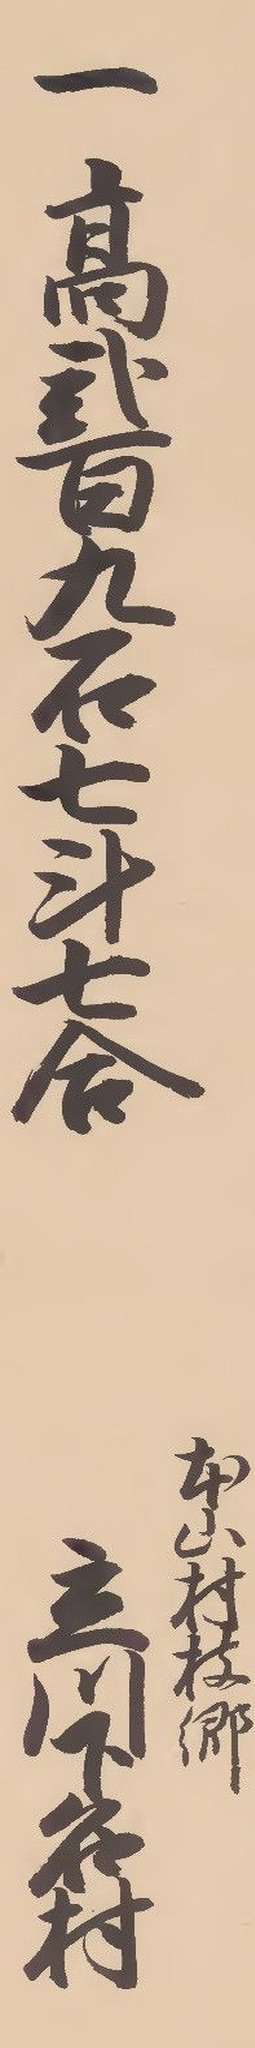一髙弐百九石七斗七合立川下名村
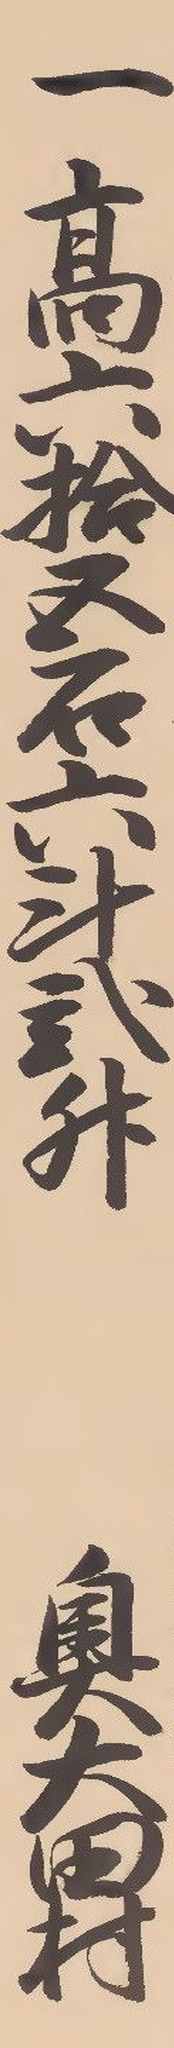一髙六拾五石六斗弐升奥大田村
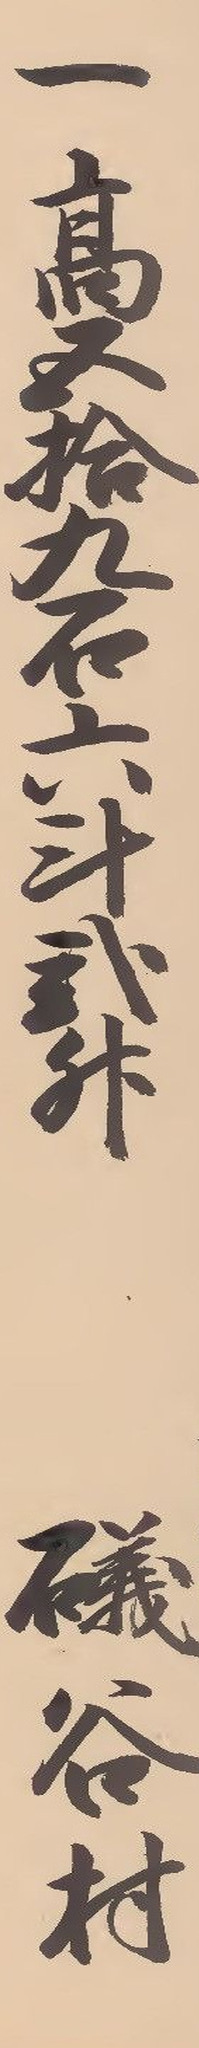一髙五拾九石六斗弐升礒谷村
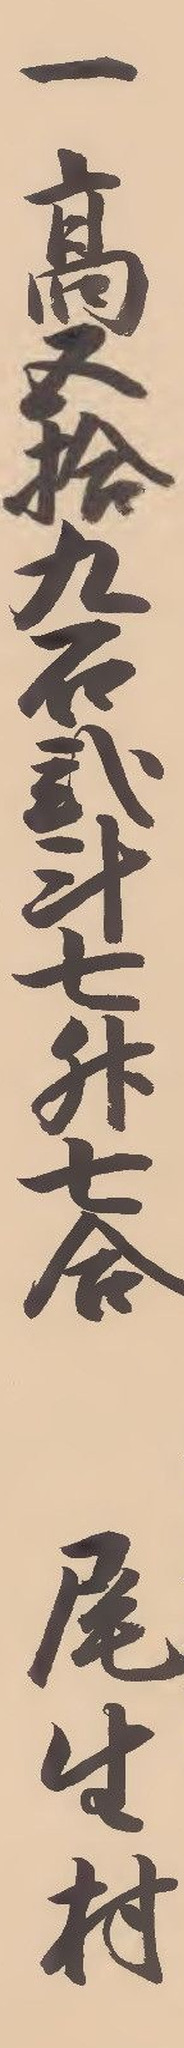一髙五拾九石弐斗七升七合尾生村
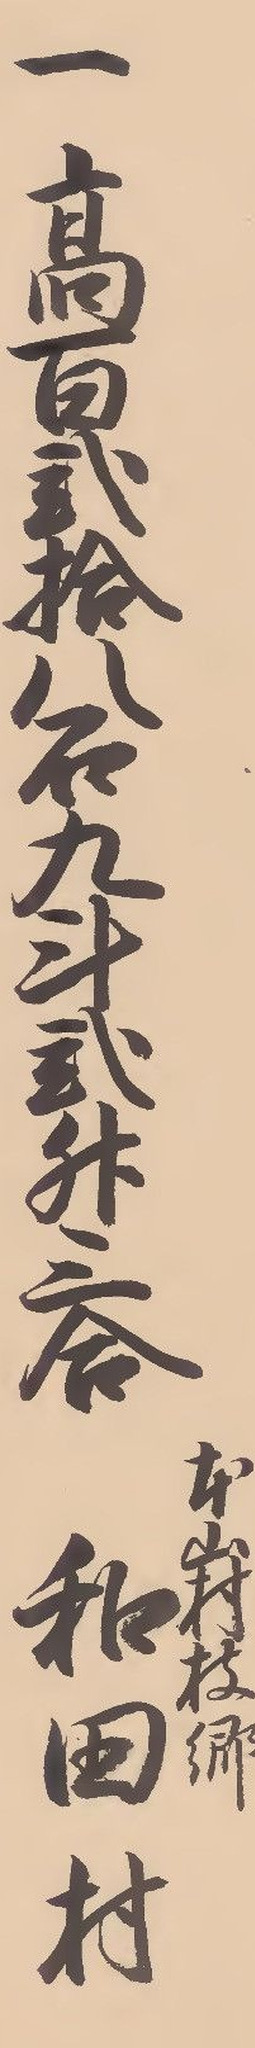一髙百弐拾八石九斗弐升三合和田村

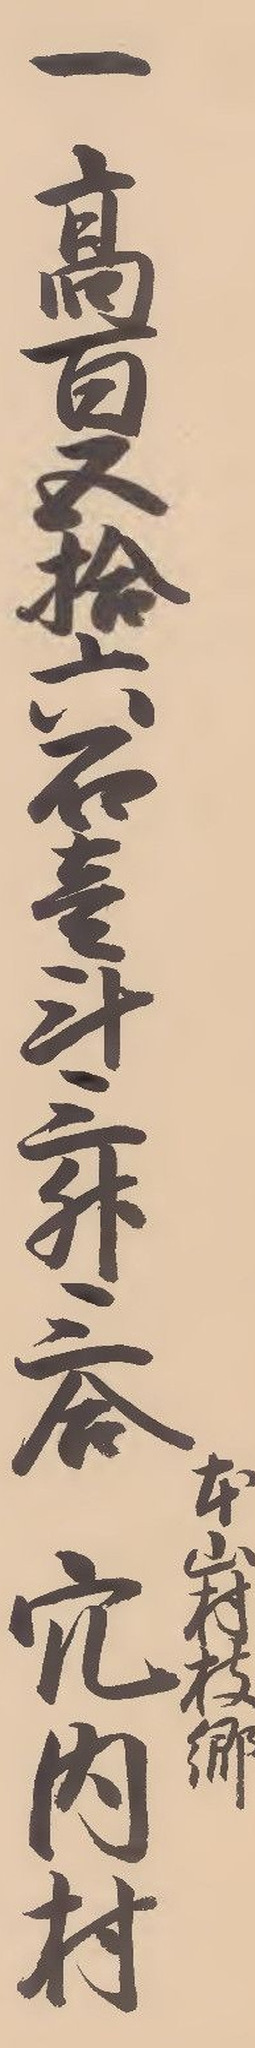一髙百五拾六石壱斗三升三合穴内村
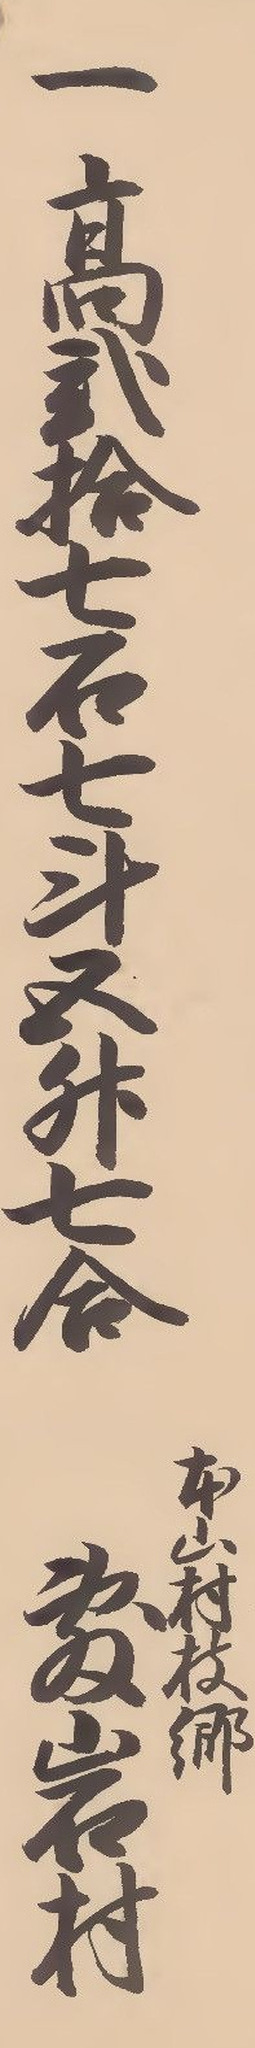一髙弐拾七石七斗五升七合敷岩村
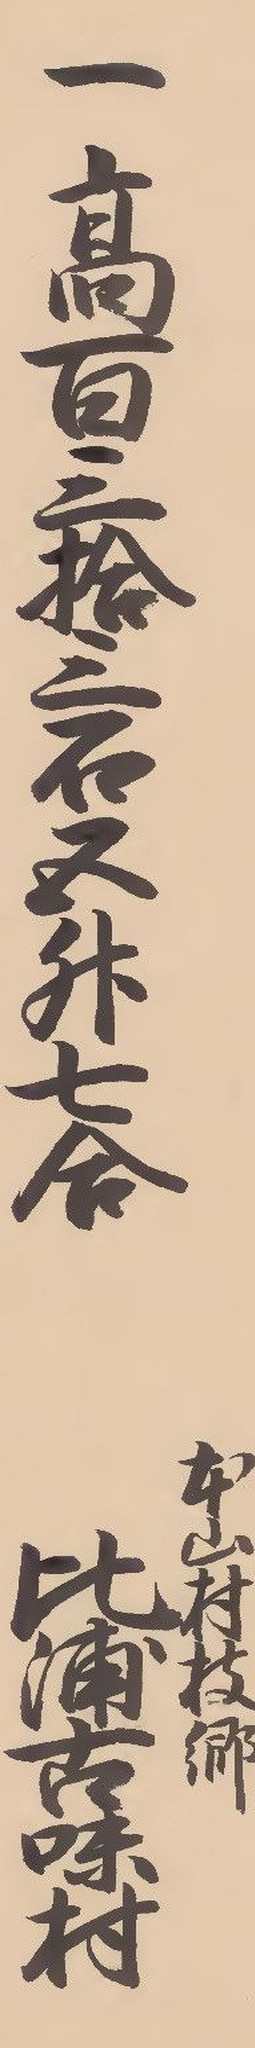一髙百三拾三石五升七合比浦古味村
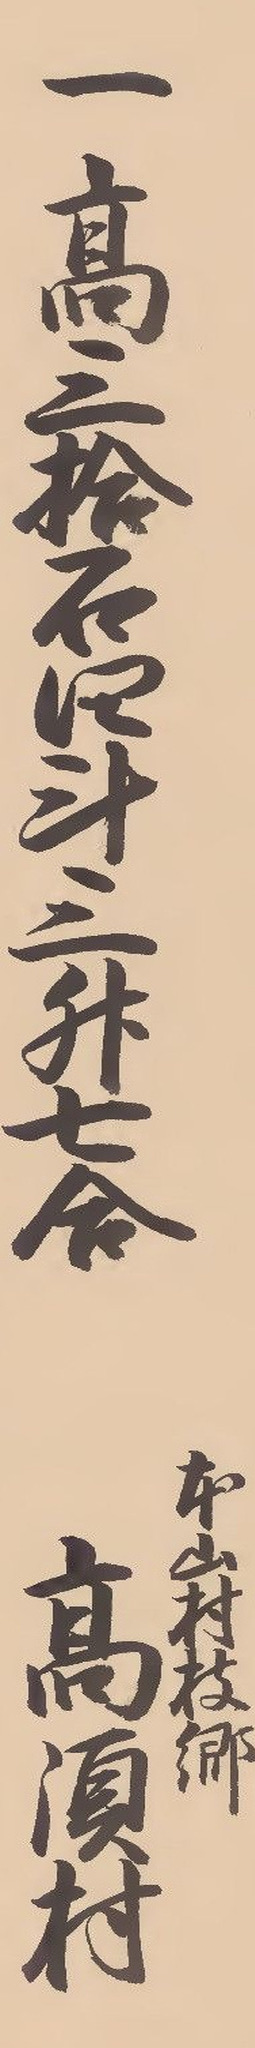一髙三拾石四斗三升七合高須村
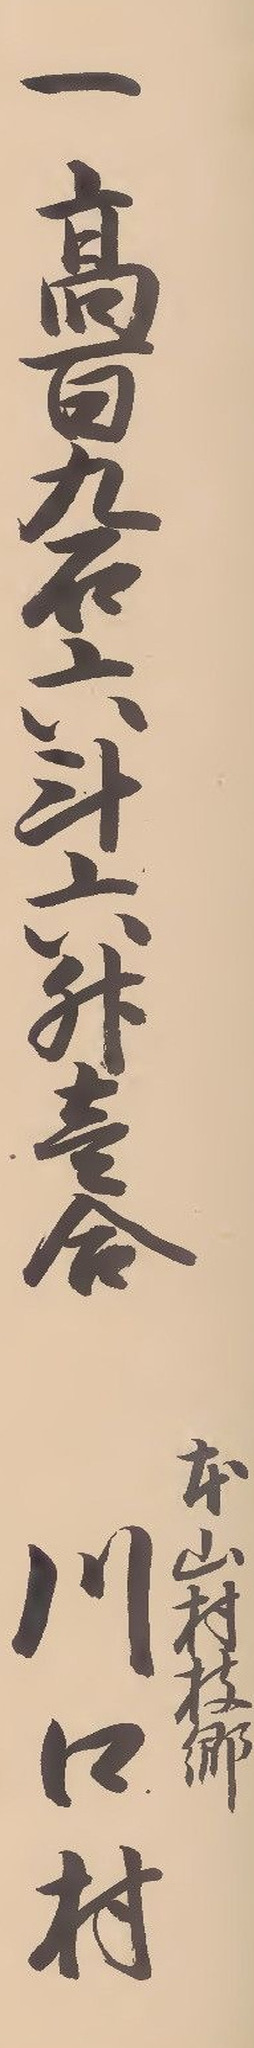一髙百九石六斗六升壱合川口村
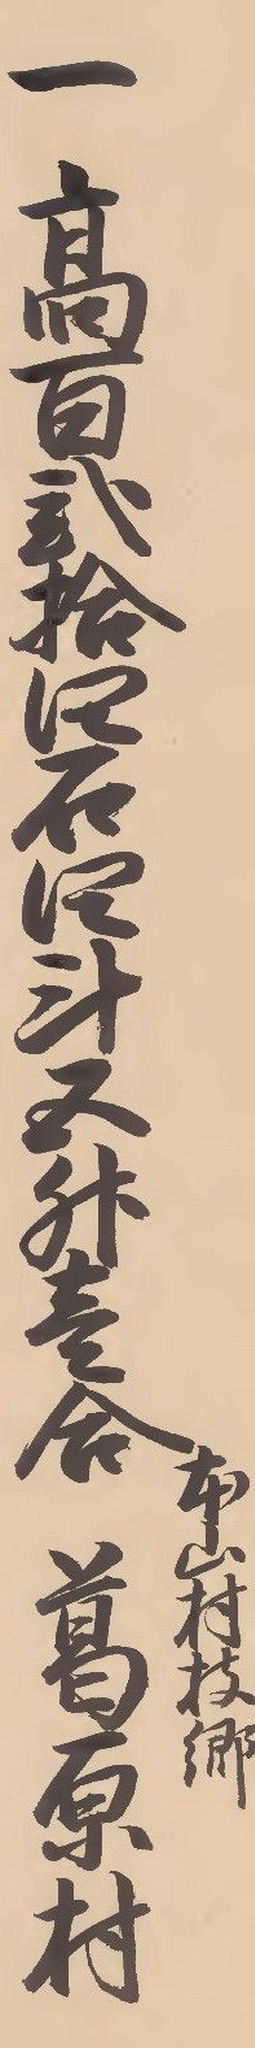一髙百弐拾四石四斗五升壱合葛原村
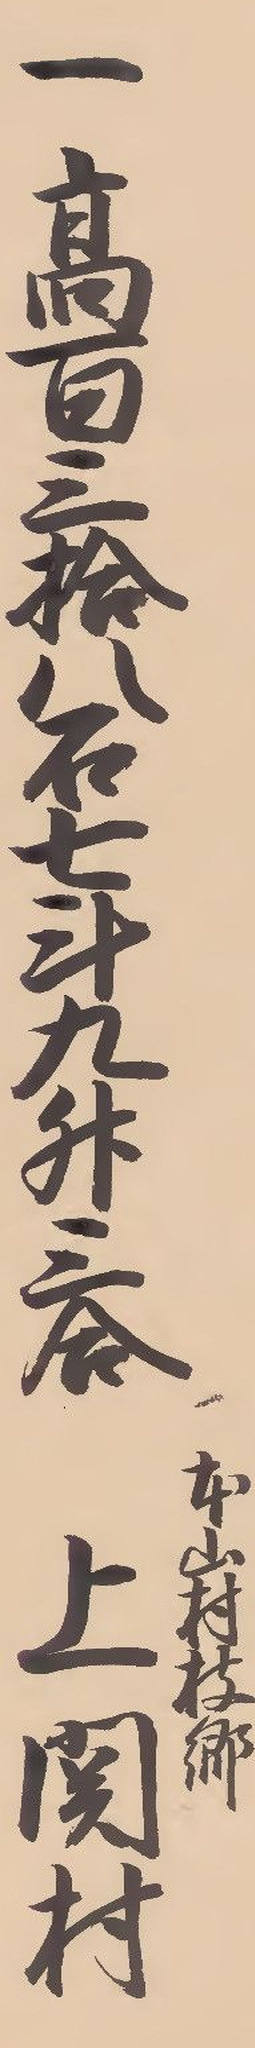一髙百三拾八石七斗九升三合上関村

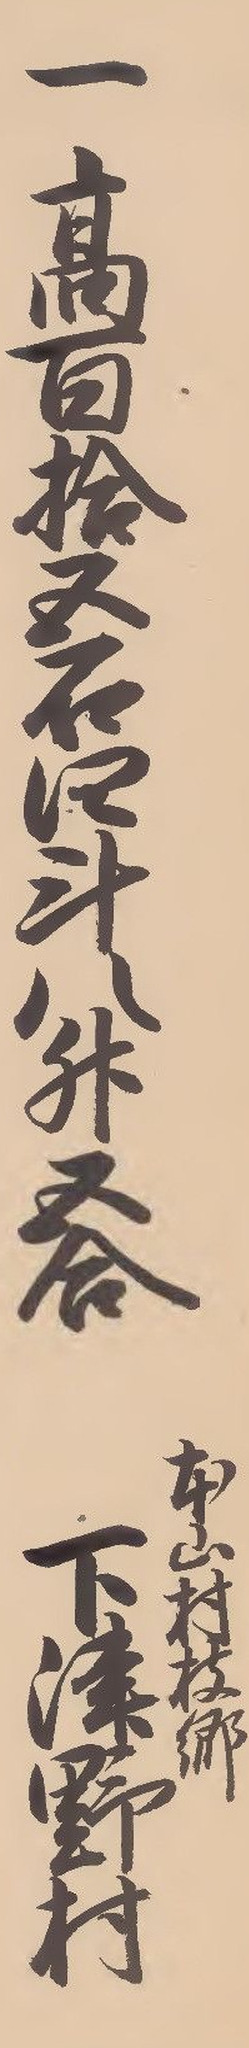一髙百拾五石四斗八升五合下津野村
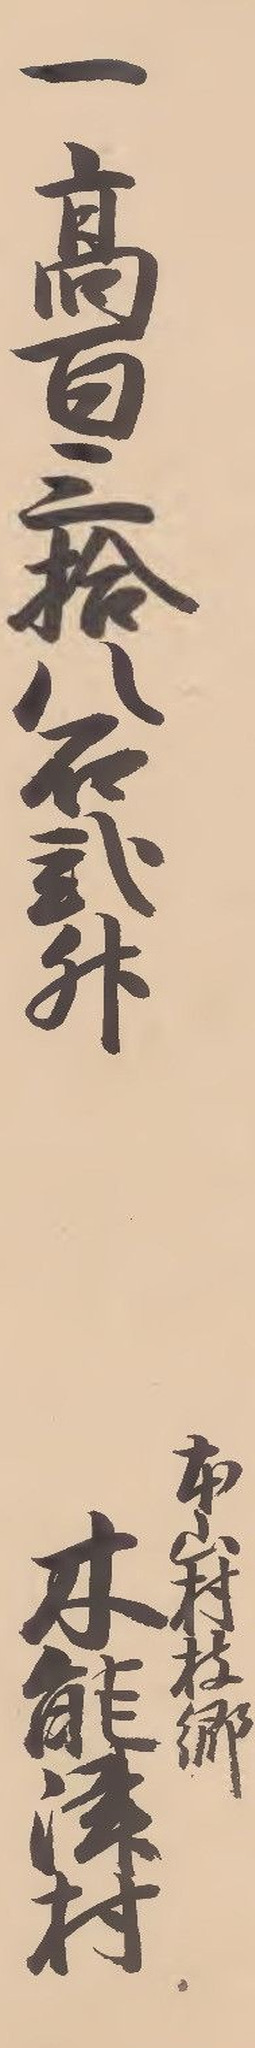一髙百三拾八石弐升木能津村
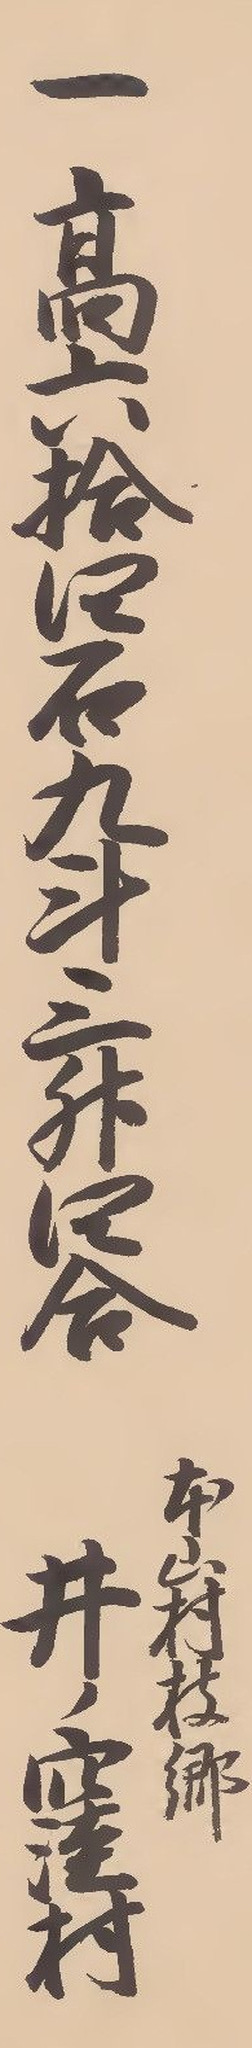一髙六拾四石九斗三升四合井ノ窪村
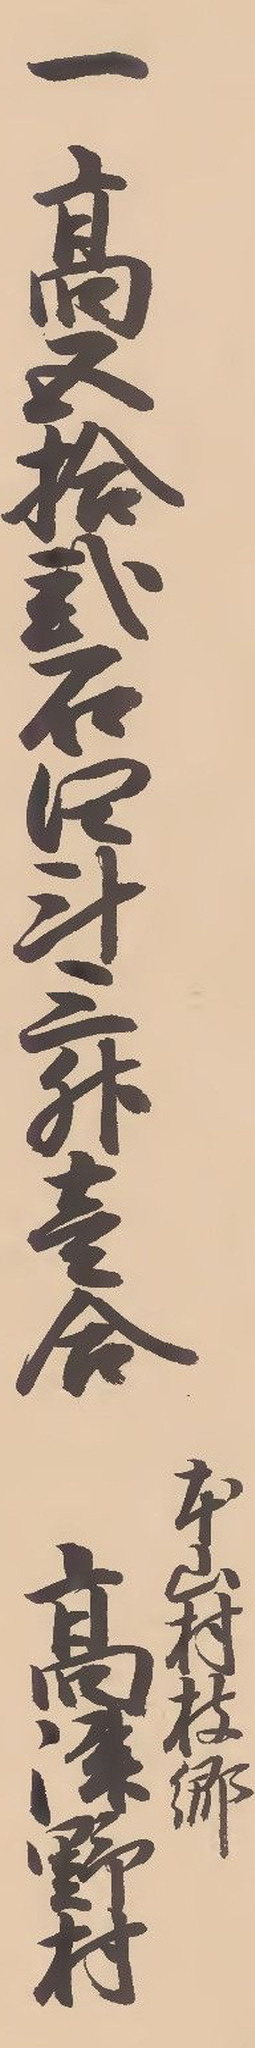一髙五拾弐石四斗三升壱合髙津野村
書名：土佐国郷帳
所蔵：国立公文書館 National Archives of Japan
